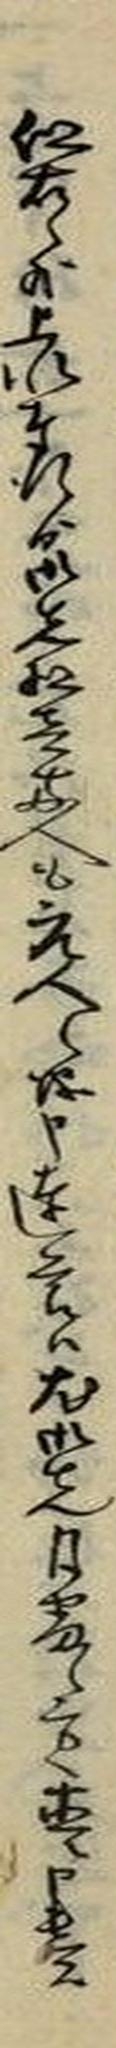但右之外上水奉行ゟ御先組壱両人も取人之儀申達節は尤御先月番之方へ直に申遣ス
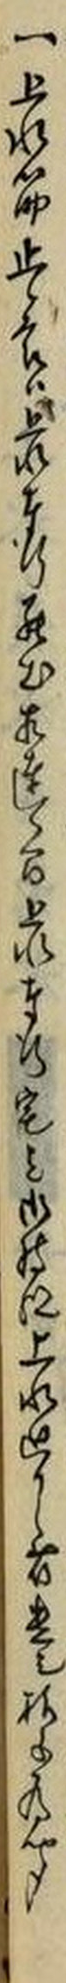一上水筋止候節は上水奉行罷出相達候間上水奉行宅迄御侍組上水廻り之者遣シ様子為聞
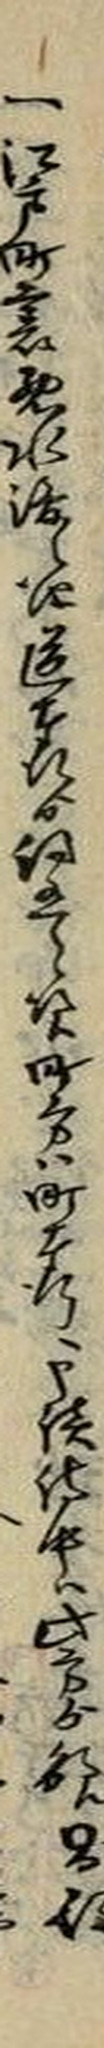一江戸町裏悪水浚之儀道奉行ゟ伺有之候得は町方は町奉行へ申談侍中は此方ゟ触ル則備
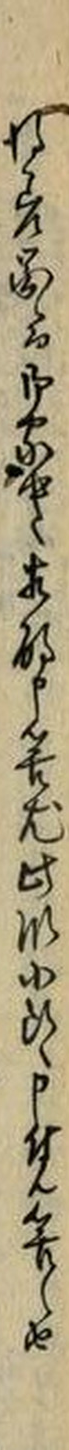得差図候て御家中へ相触申筈尤此段小頭へ申付ル筈之由
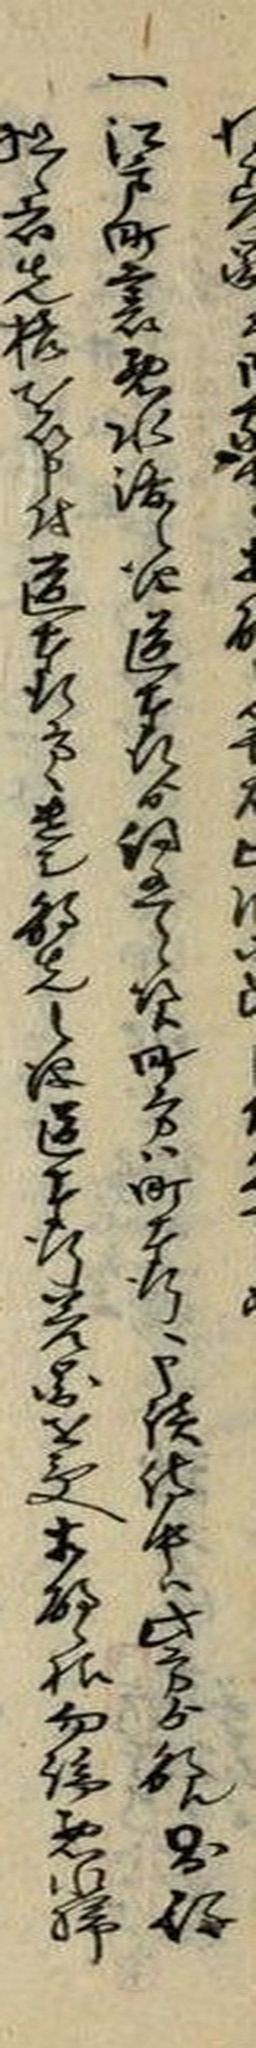組之者先格を以申付道奉行方へ遣シ触先之儀道奉行差図を受相触候様勿論悪水掃
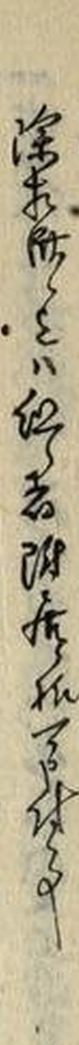除相済候迄は組之者附居候様可申付事
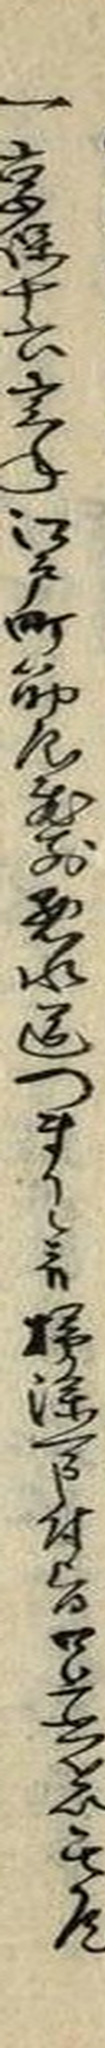一享保十六寅年江戸町筋屋敷前悪水道つまり候に付可掃除申付旨口上書を以其屋
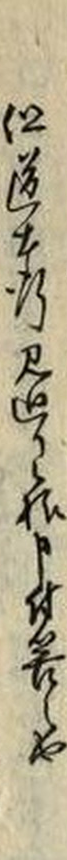但道奉行見廻り候様申付筈之由
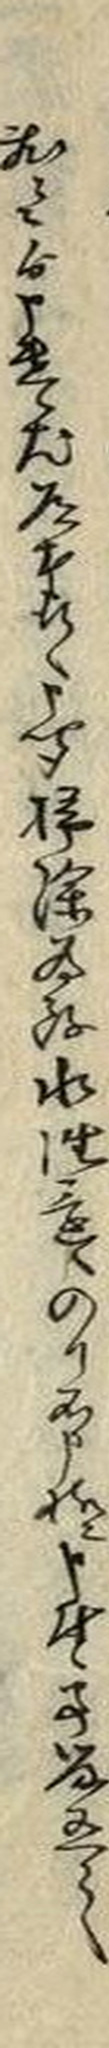敷々々ゟ申遣候尤道奉行へ申聞掃除為致水往還へのり不申様に申付候事留有之
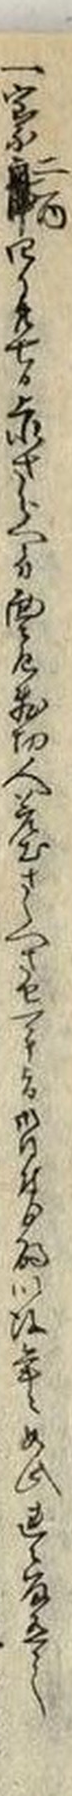一宝永二酉四月廿七日上水さらへに付面々屋敷切人差出さらへさせ可申旨御目付ゟ触以後年々如此連々留有之
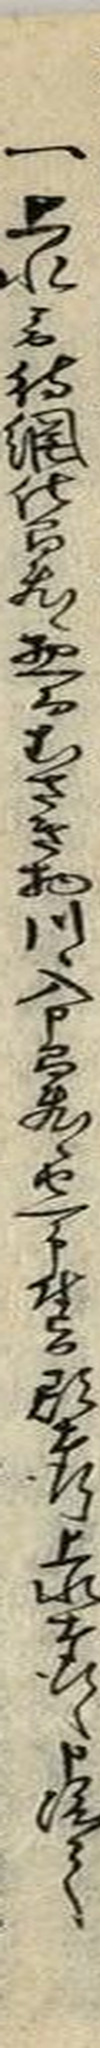一上水にて待網仕間敷候惣てむさき物川へ入申間敷候由可申付旨郡奉行上水奉行へ申渡之
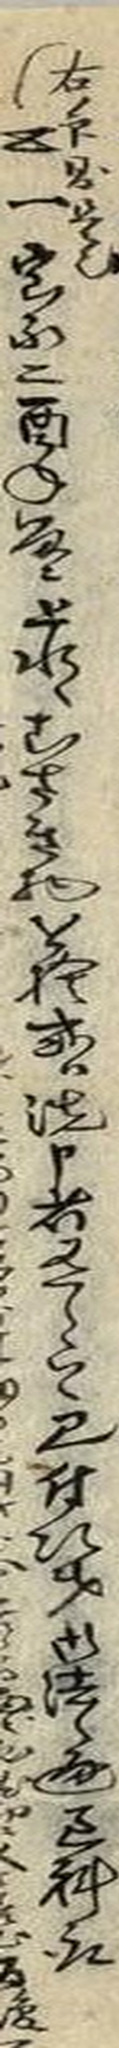一宝永二酉年留に上水へむさき物を捨或は洗申者有之候はゝ見付次第御法之通過料取
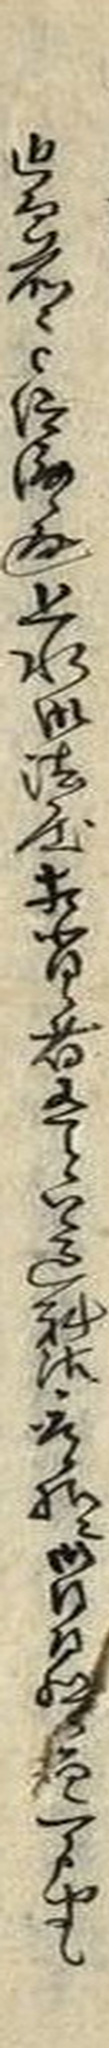追て前々被仰渡候通上水御法度相背候者有之候はゝ過料銀取候様に御目付組之者へ可申聞候
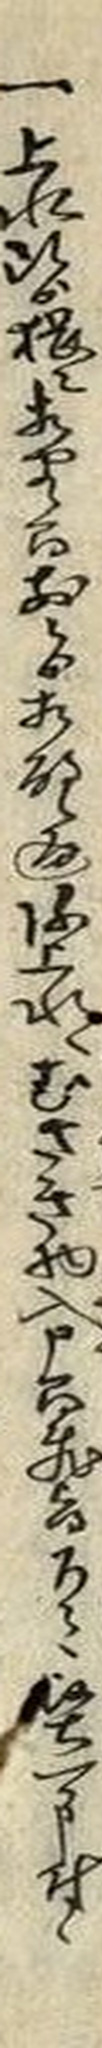一上水頭ゟ猥に相聞候間前々ゟ相触候通弥上水へむさき物入申間敷旨下々へ堅可申付候
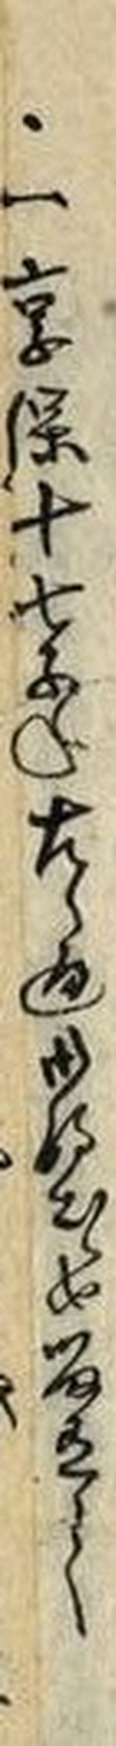一享保十七子年左之通御触出候由留有之
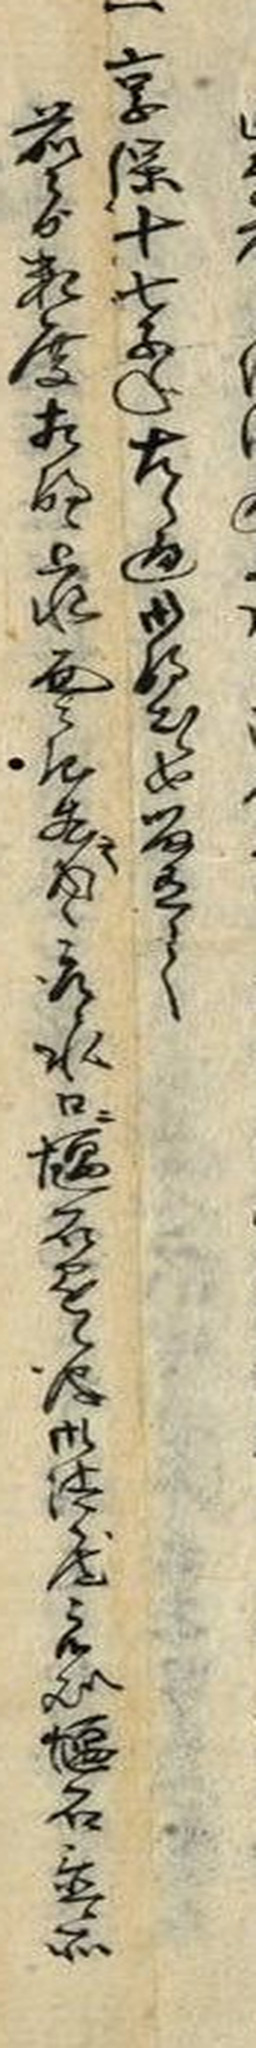前々ゟ数度相触候上水面々屋敷之内へ取水口に堰石懸候儀御法度に候処堰石置候所
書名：御城下諸事之部
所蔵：福井県文書館 Fukui Prefectural Archives
